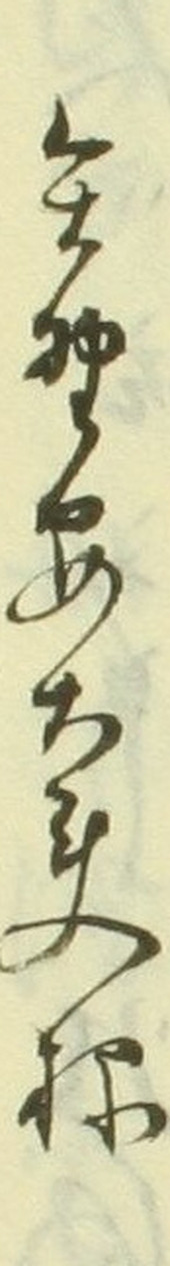矢野安大夫様
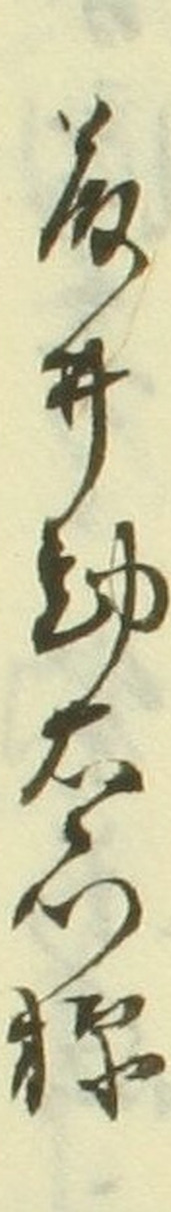藤井勘右衛門様
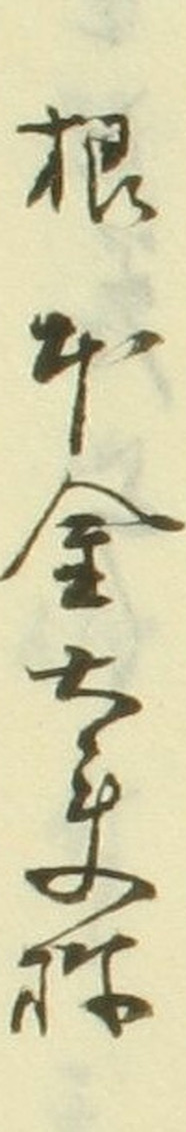根本金太夫様
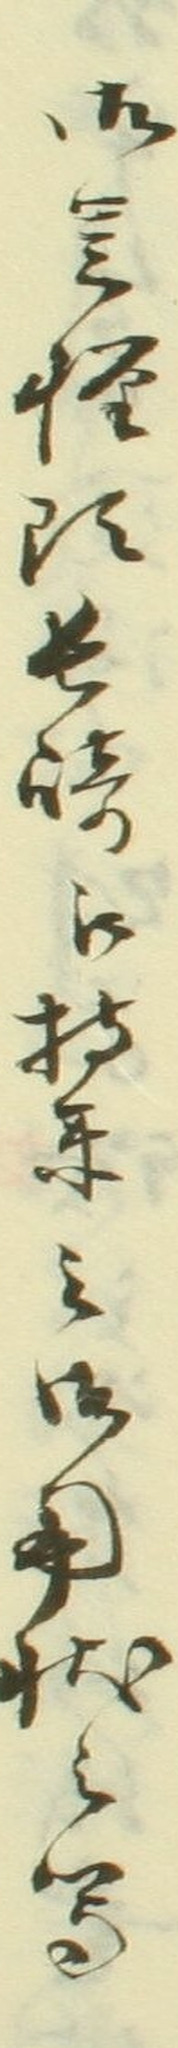御足軽頭長崎え持参之御用状之写
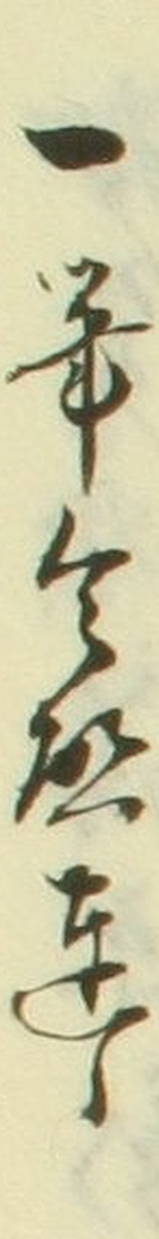一筆令啓達候
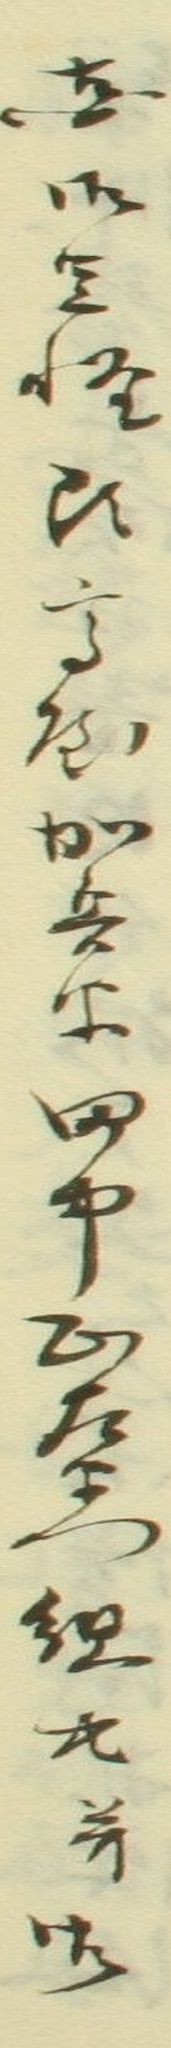固御足軽頭高屋加兵衛田中正左衛門組共幷御
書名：朝鮮船御領内漂流記 乾
